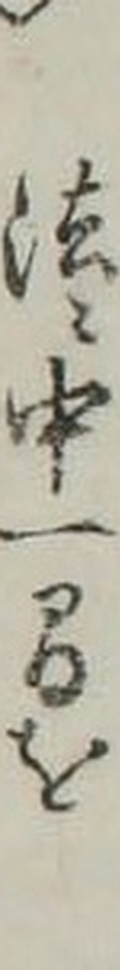半法に中一間を
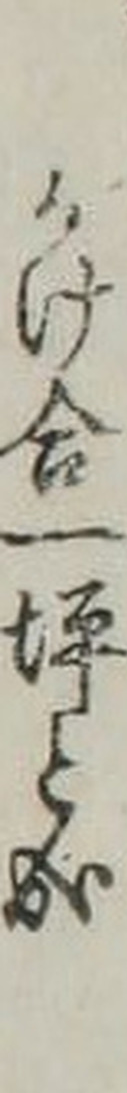かけ合一坪と成
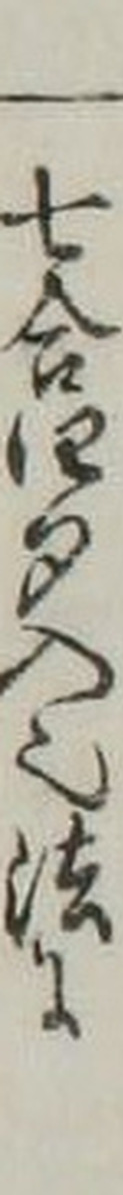七合四勺入也法に
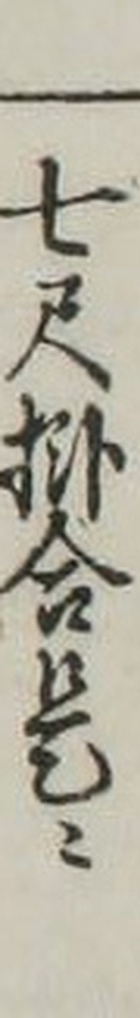七尺掛合是に七尺
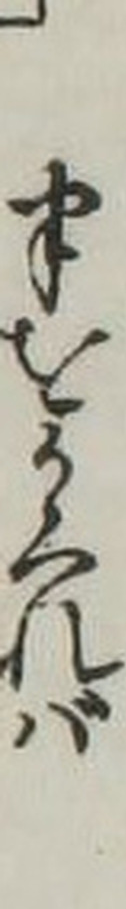半をかくれば
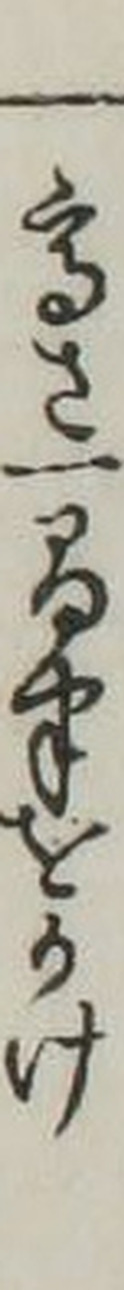高さ一間半をかけ
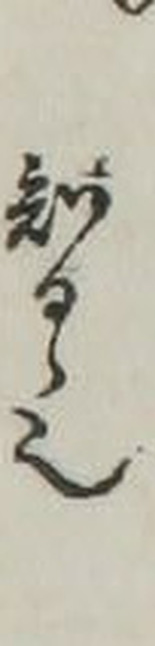知るゝ也
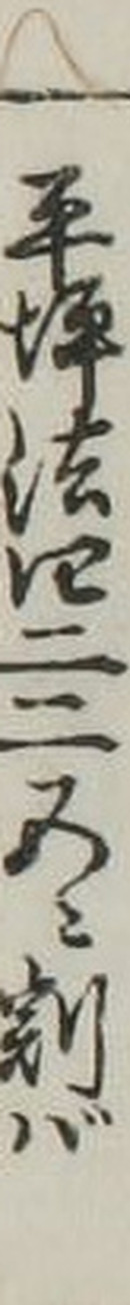平坪法四二二五に割ば
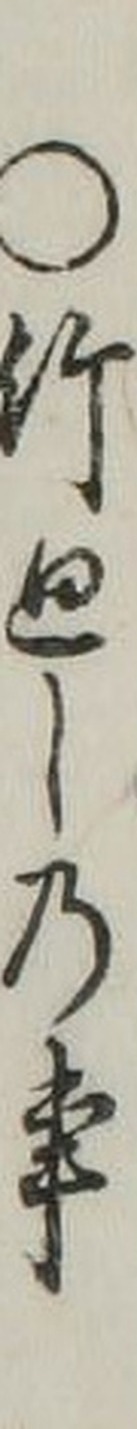○竹廻しの事
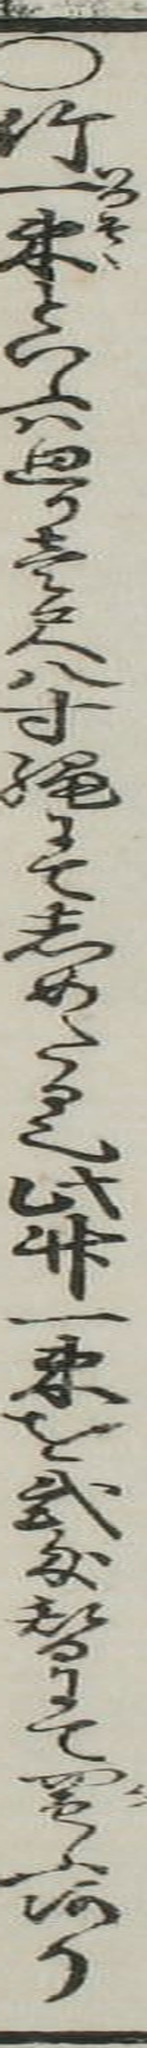○竹一束といふは廻り壱尺八寸縄にてしめたる也此竹一束を弐匁替にて買ふあり
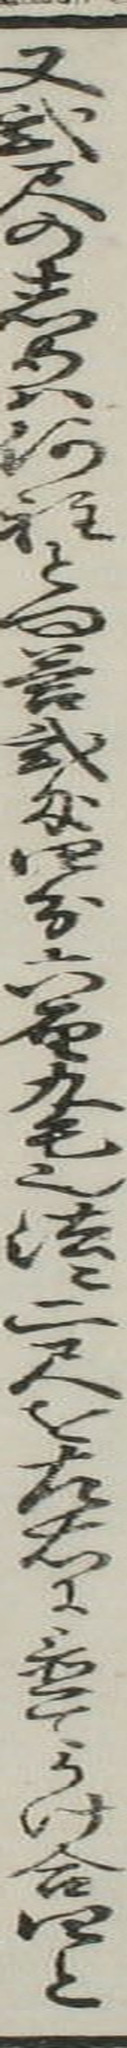又弐尺のしめは何程と問答弐匁四分六厘九毛也法に二尺を左右に置てかけ合四と
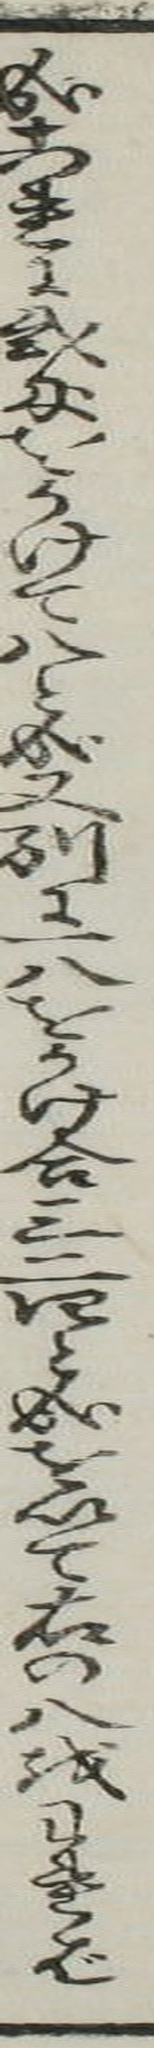成これに弐匁をかけて八と成又別に一八をかけ合三二四と成を以て右の八をわれば
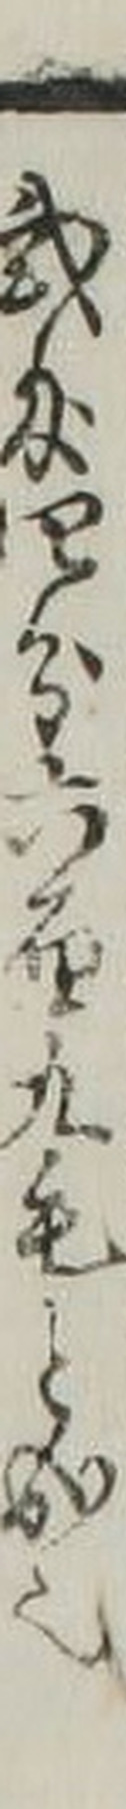弐匁四分六厘九毛と成也
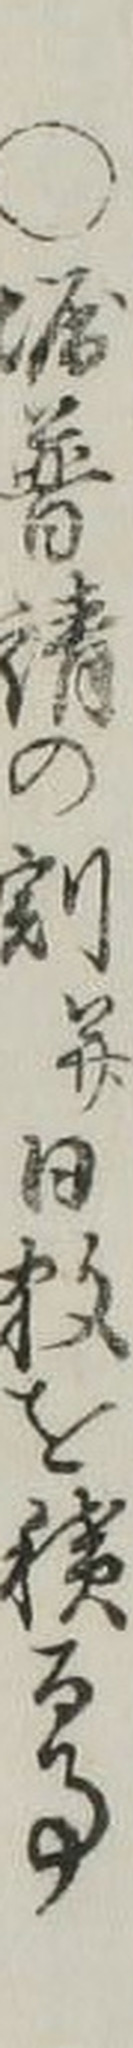○堀普請の割并日数を積る事
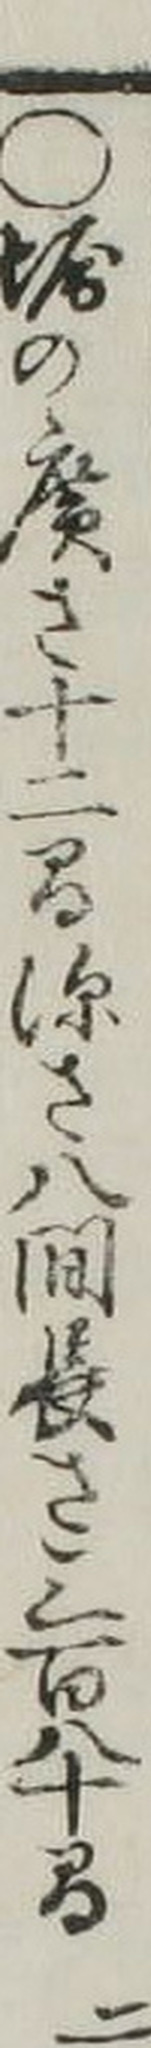○堀の広さ十二間深さ八間長さ三百八十間
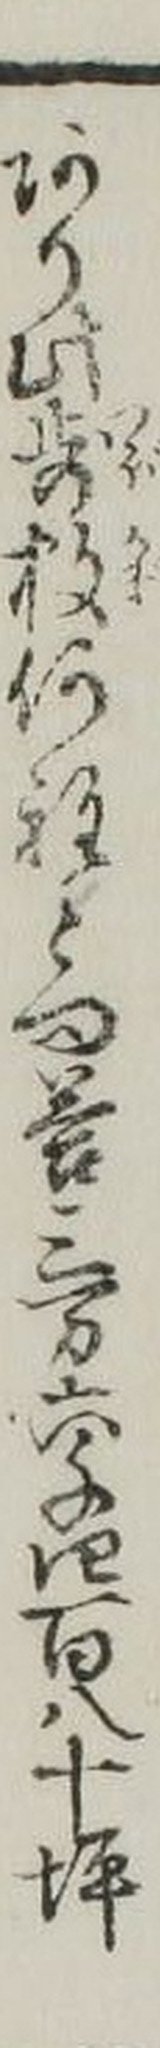あり此歩数何程と問答三万六千四百八十坪
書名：宝玉塵劫記
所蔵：東京学芸大学教育コンテンツアーカイブ
